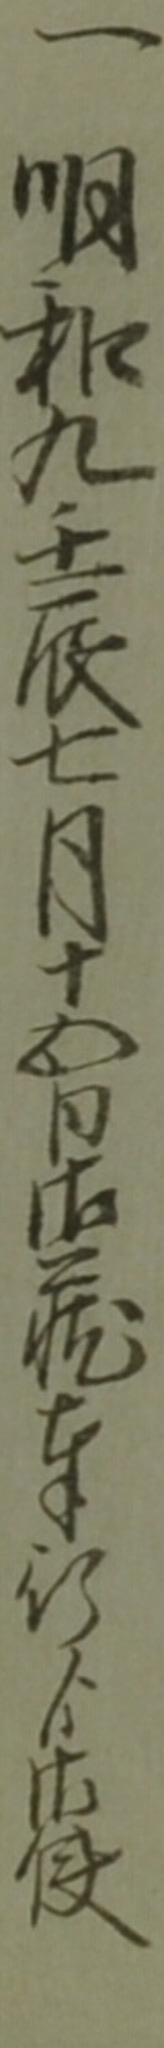一明和九壬辰七月十五日御蔵奉行ゟ御使
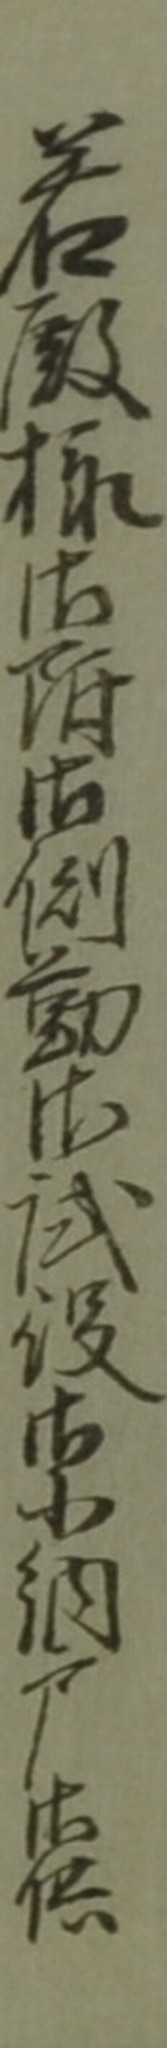若殿様御附御側勤御試役御小納戸御供
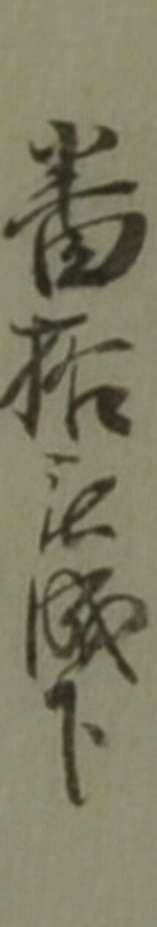番格被成下
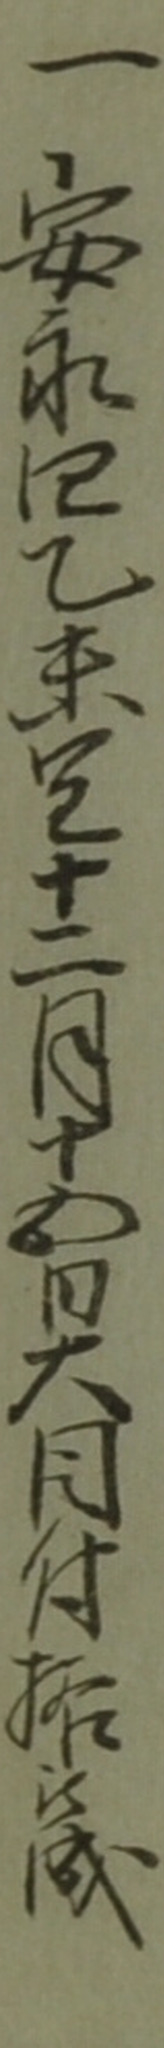一安永四乙未閏十二月十五日大目付格被成
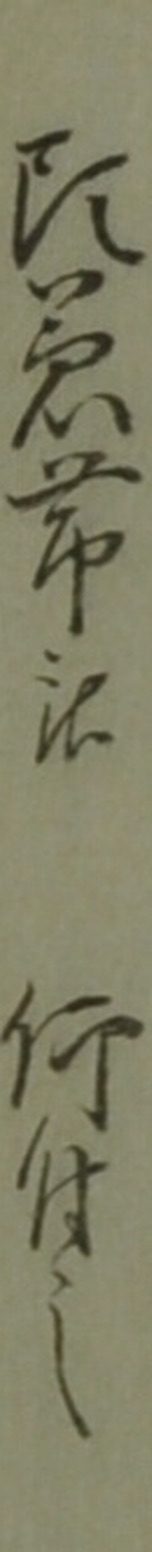頭兼帯被仰付之
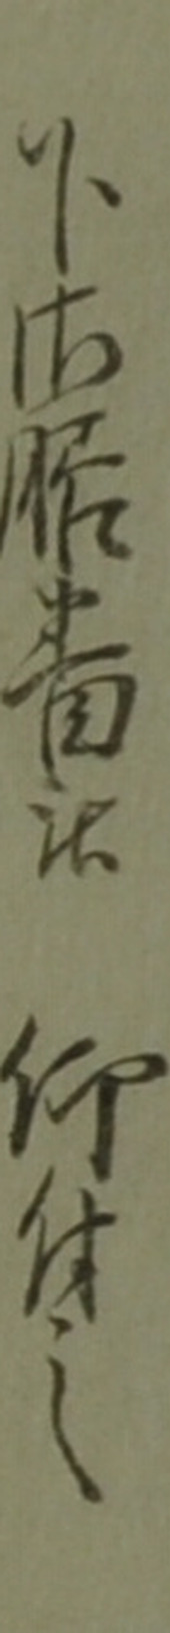下御膳番被仰付之
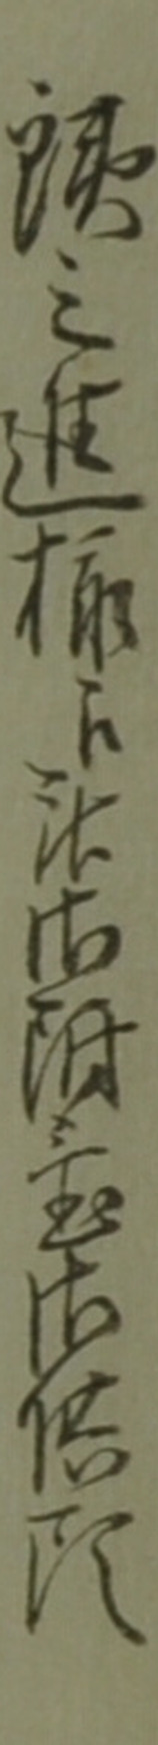鉄之進様江被御附置御供頭

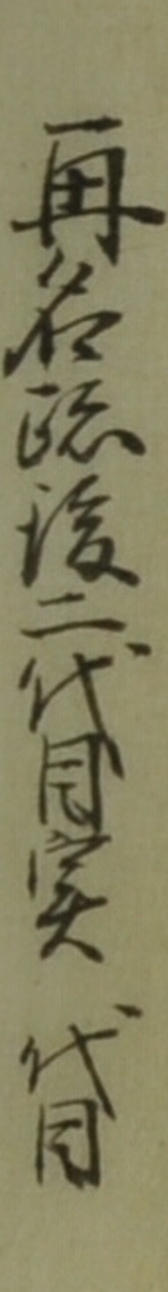再名跡後二代目実代目
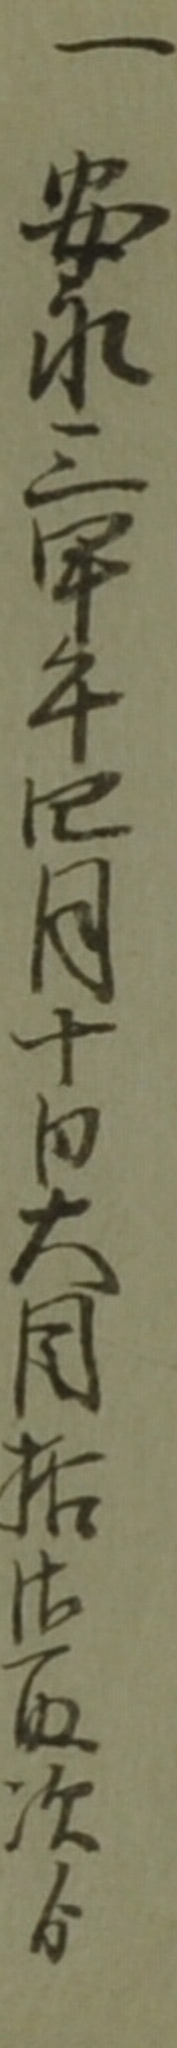一安永三甲午四月十日大目格御取次ゟ
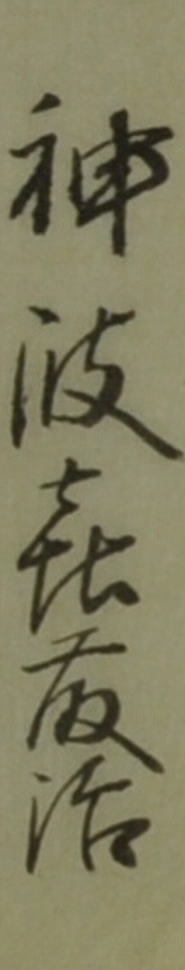神波喜藤治
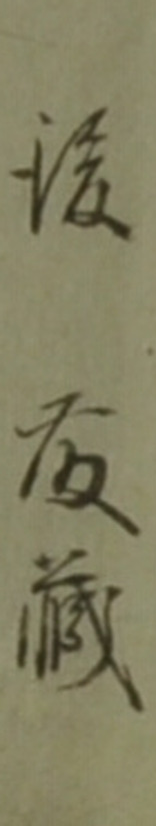後藤蔵
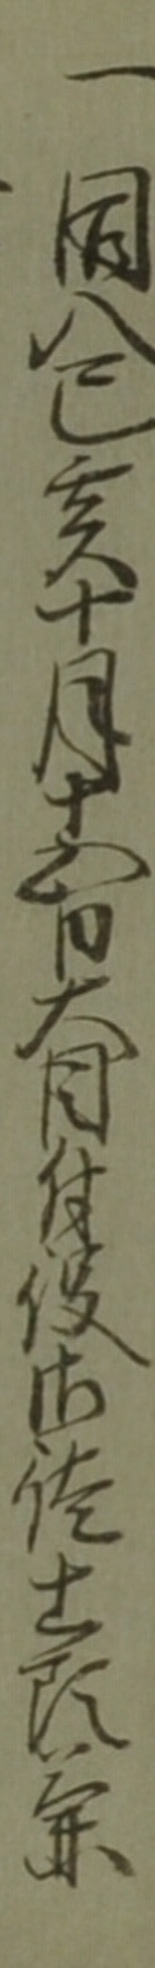一同八己亥十月十五日大目付役御徒士頭兼
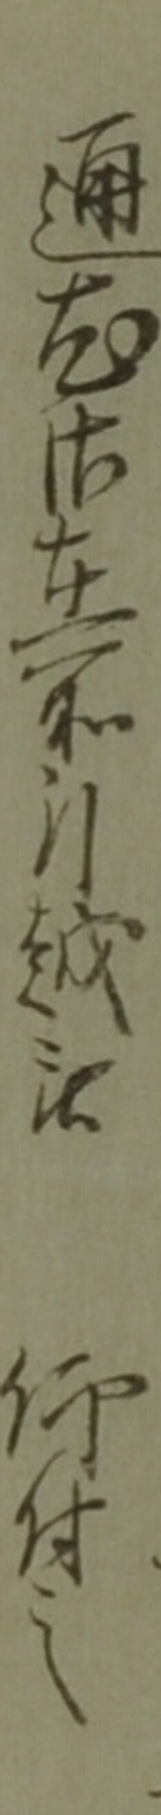通尤御在所引越被仰付之
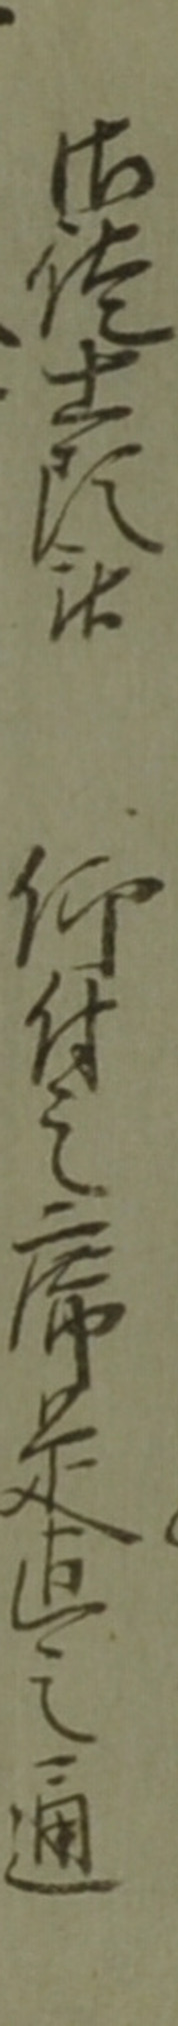御徒士頭被仰付之席是迄之通
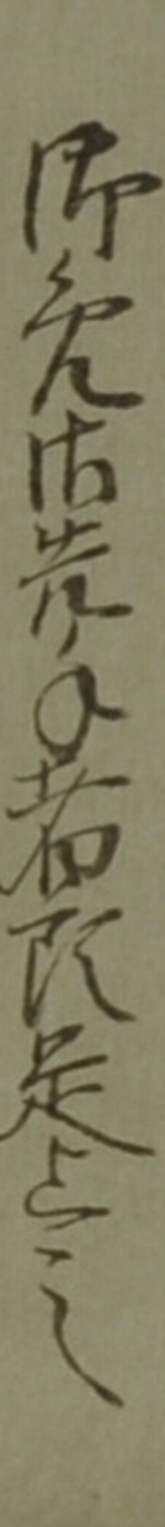帯御免御先手者頭是迄之
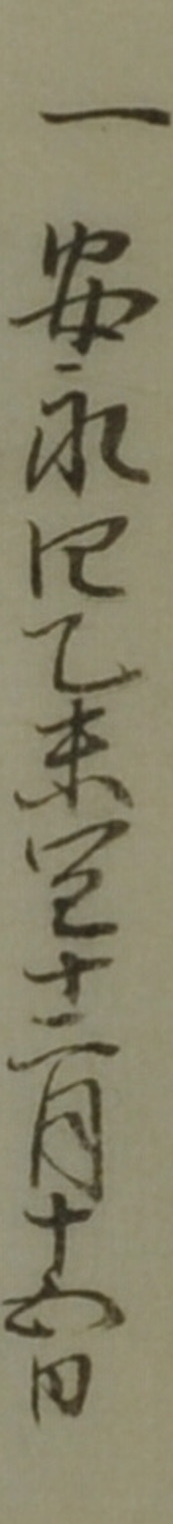一安永四乙未閏十二月十五日
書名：諸御役代々録（六）
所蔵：伊那市立高遠町図書館・合同会社AMANE
